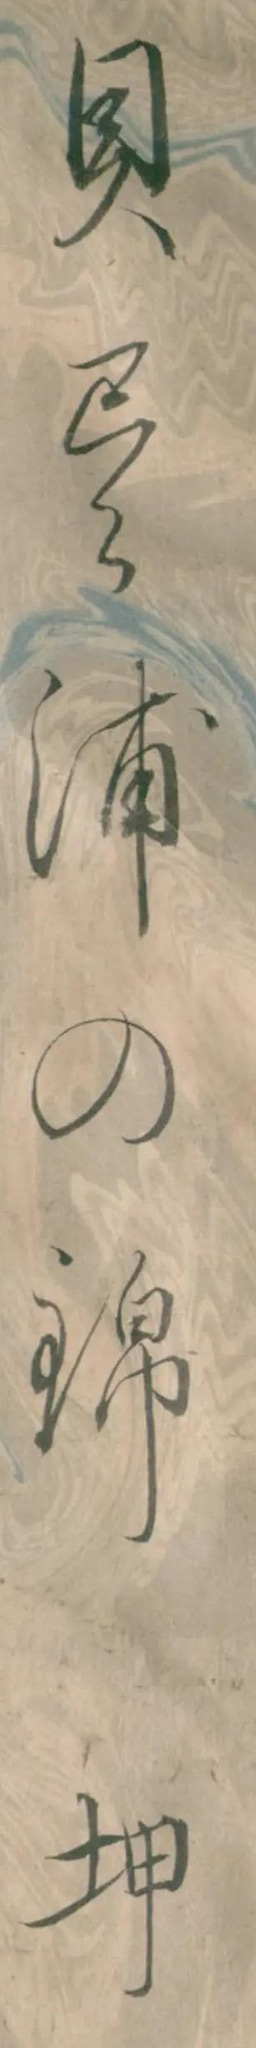貝尽浦の錦坤
